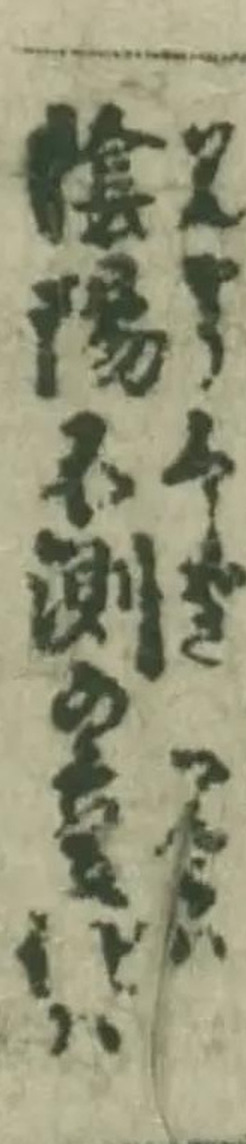陰陽不測の変化は
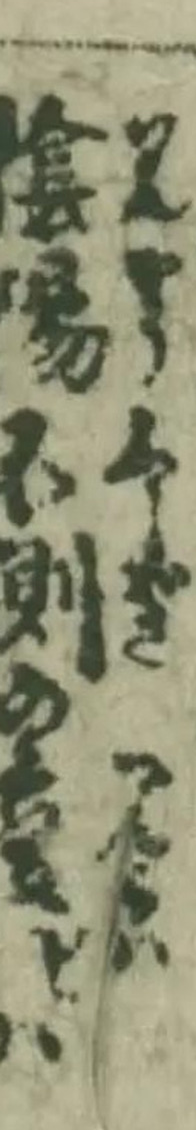陰陽不測の変化は
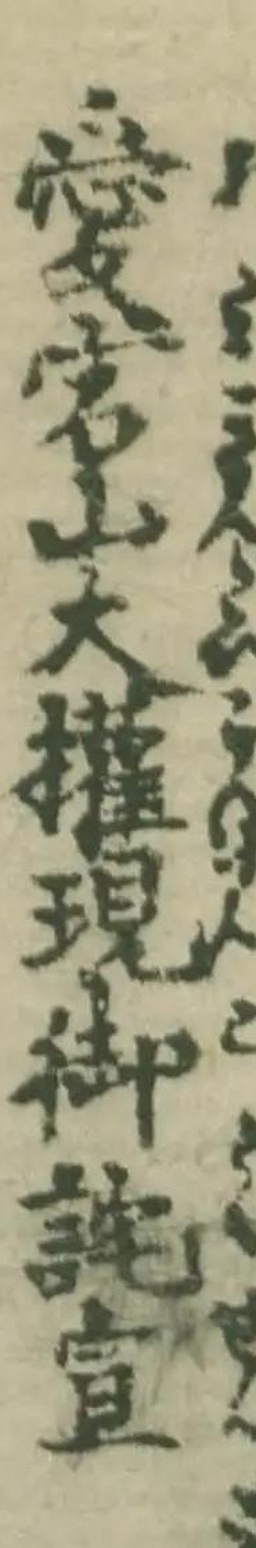愛宕山大権現御託宣
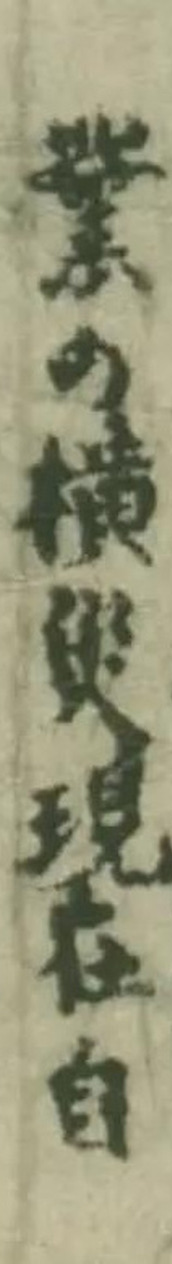業の横災現在自
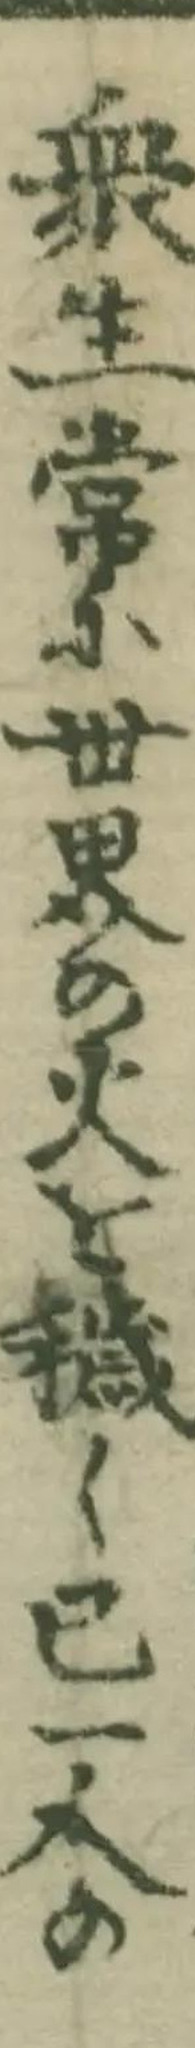衆生常に世界の火を穢し己一人の
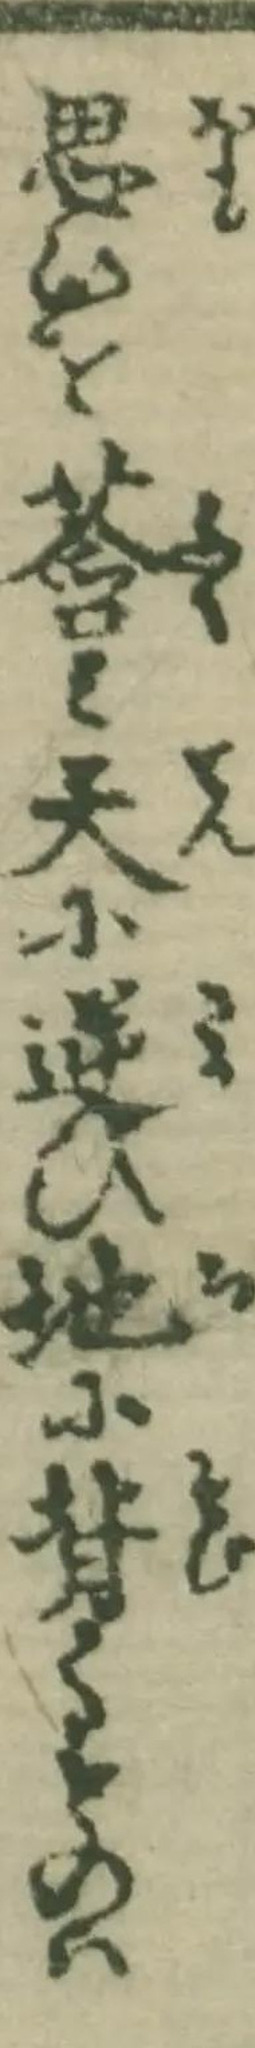思いを莟み天に逆ひ地に背くものは
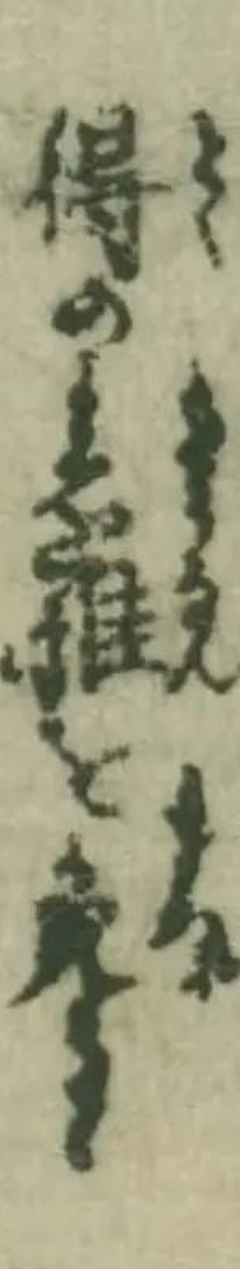得の難を免るゝ
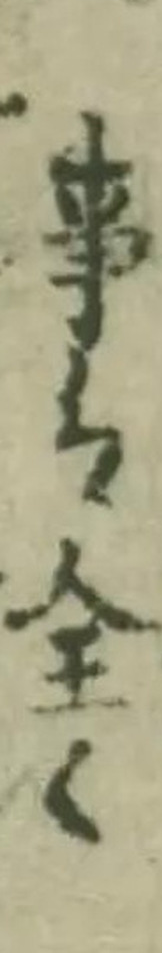事は全く
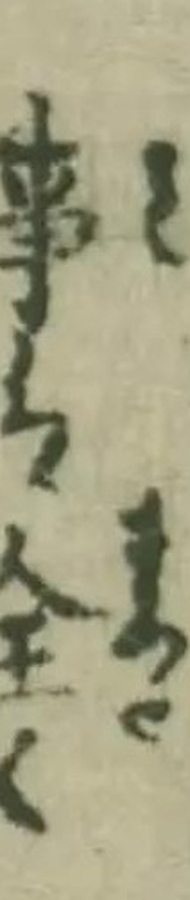事は全く
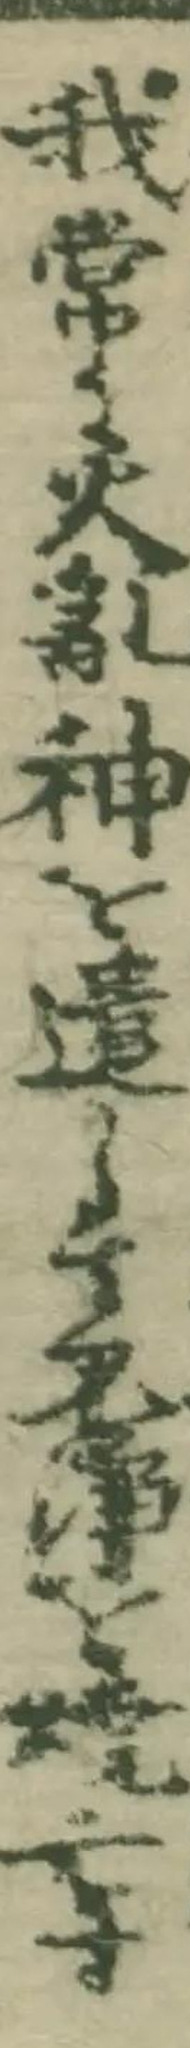我常に火乱神を遣し其不浄を焼亡す
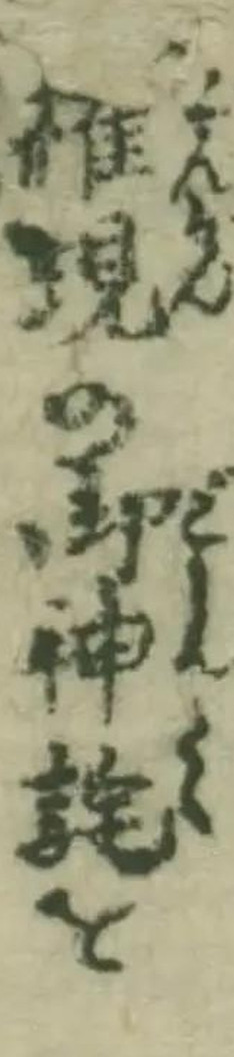権現の御神託を
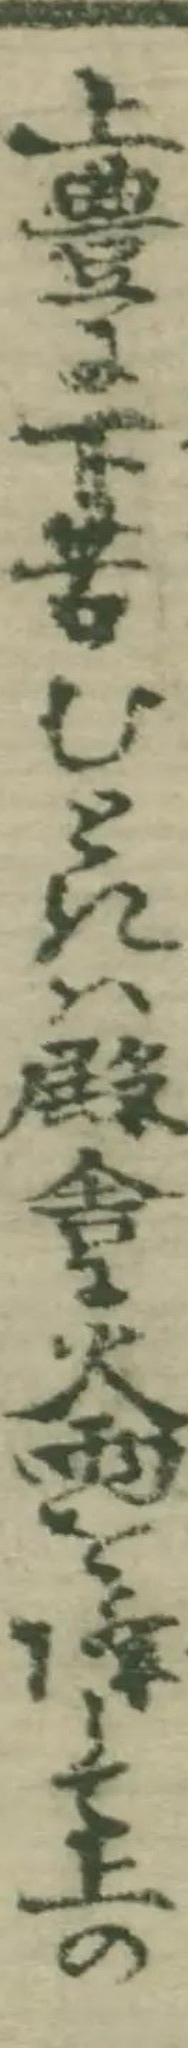上豊に下苦むときは殿舎に火雨を降して上の
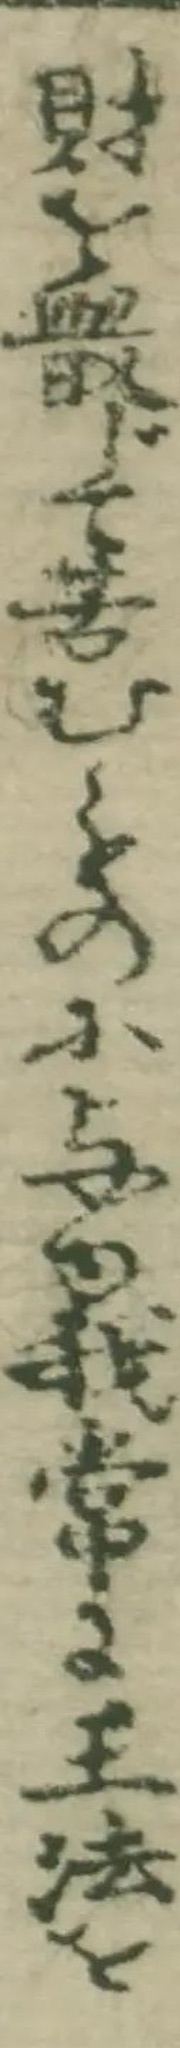財を最じて苦むものに与ゆ我常に王法を
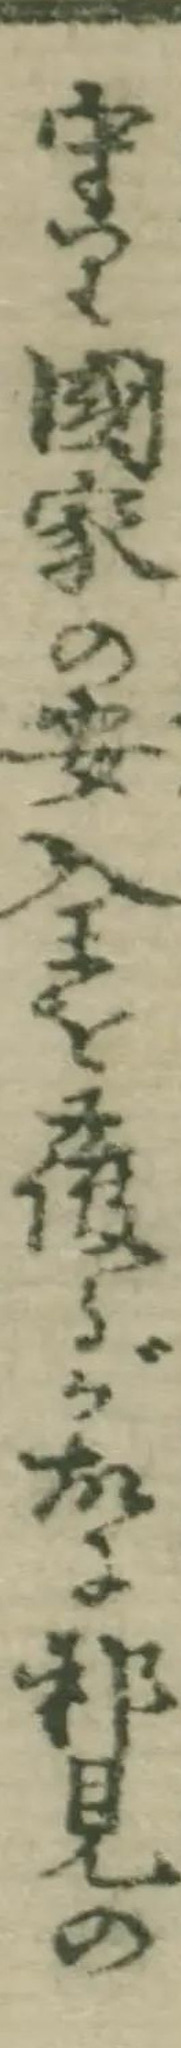守り國家の安全を護るが故に邪見の
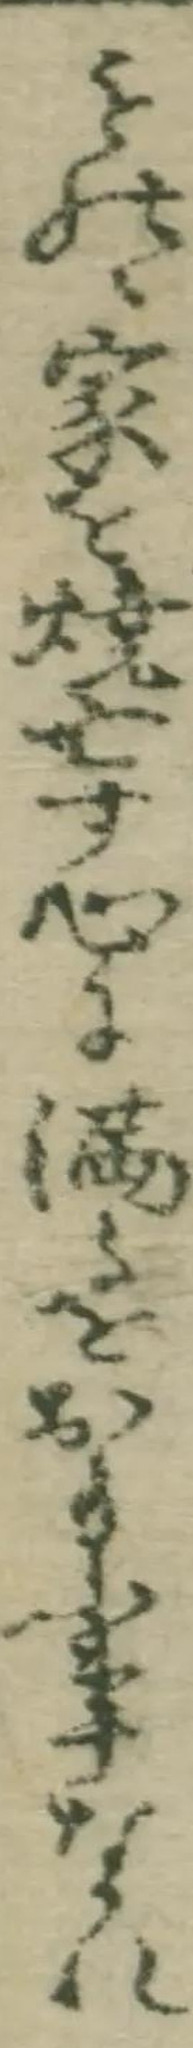ものゝ家を焼亡す心に満るをおもふ事なかれ
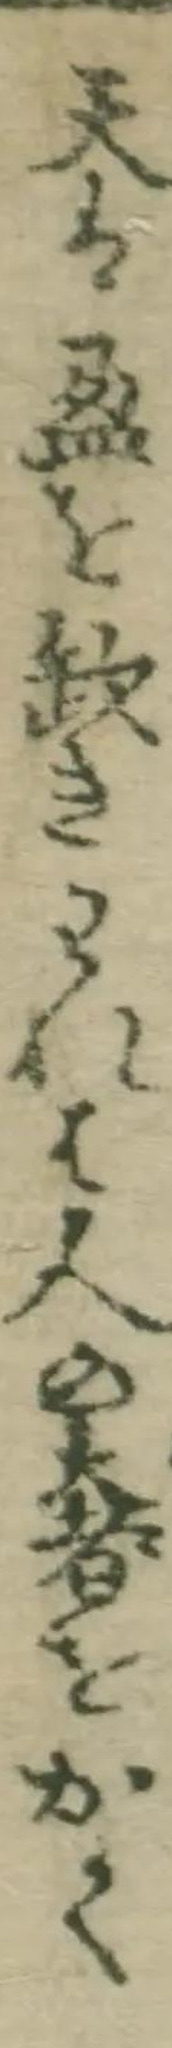天は盈を欫きわれは人の奢をかく
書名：信濃國六郡大地震滿水之圖
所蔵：国立国会図書館 National Diet Library, JAPAN
